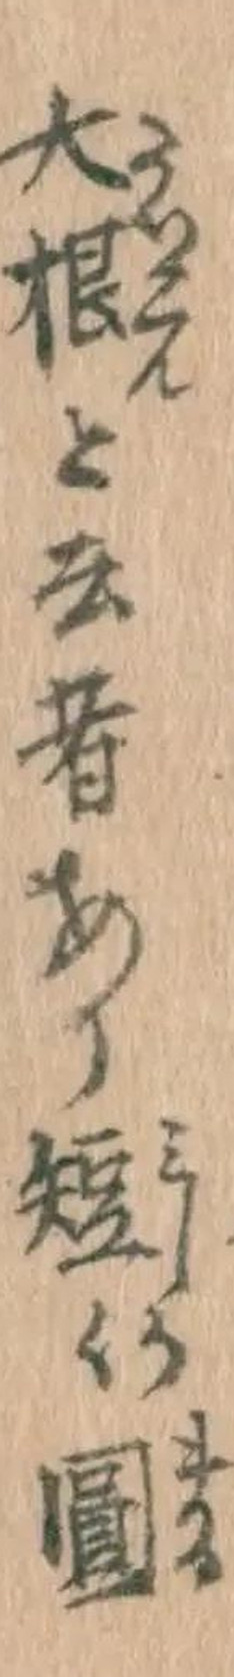大根と云者あり短く円
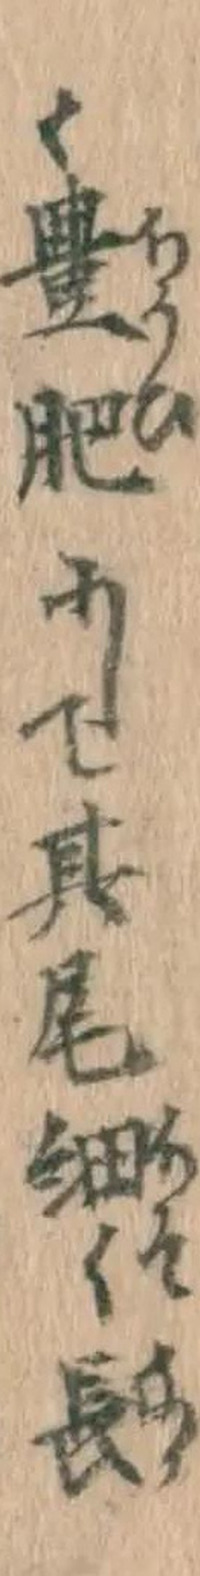く豊肥にして其尾細く長
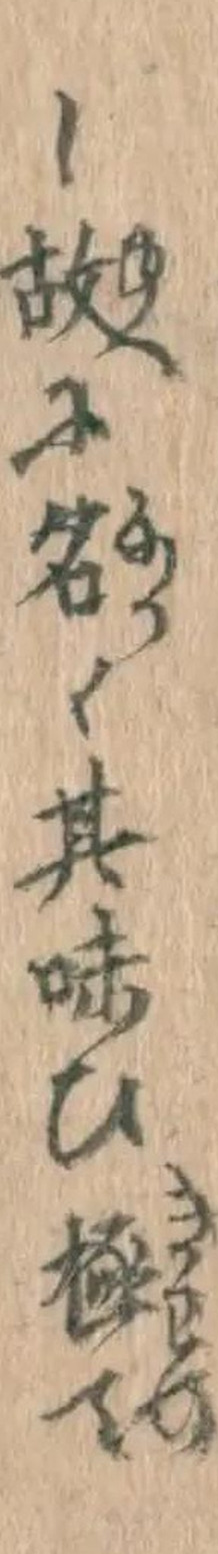し故に名く其味ひ極て
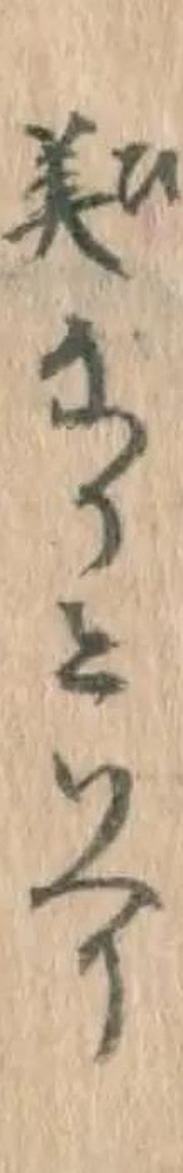美なりといへり

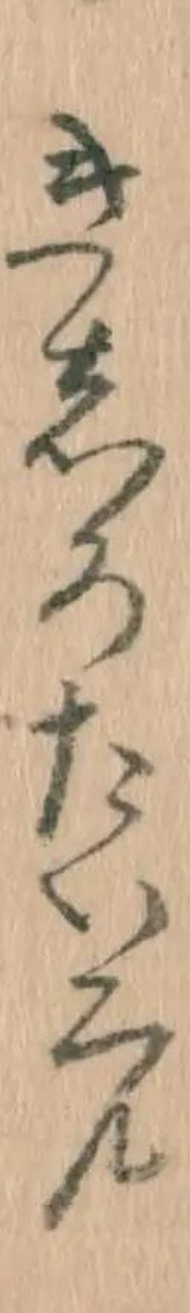きしろたいこん
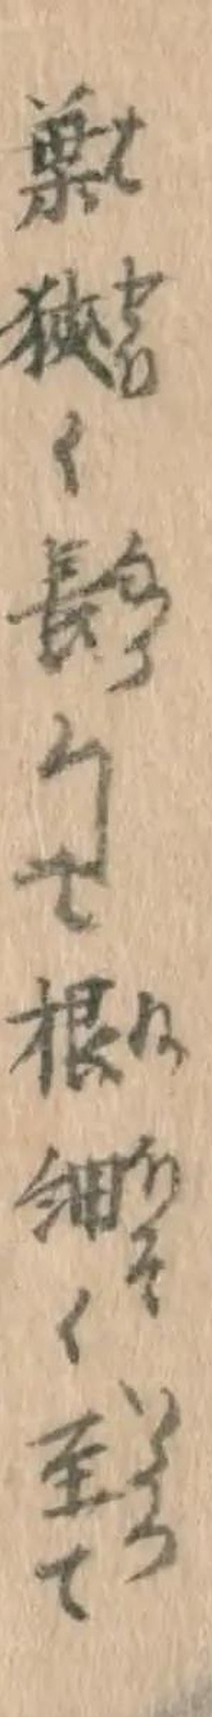葉狭く長くして根細く至て
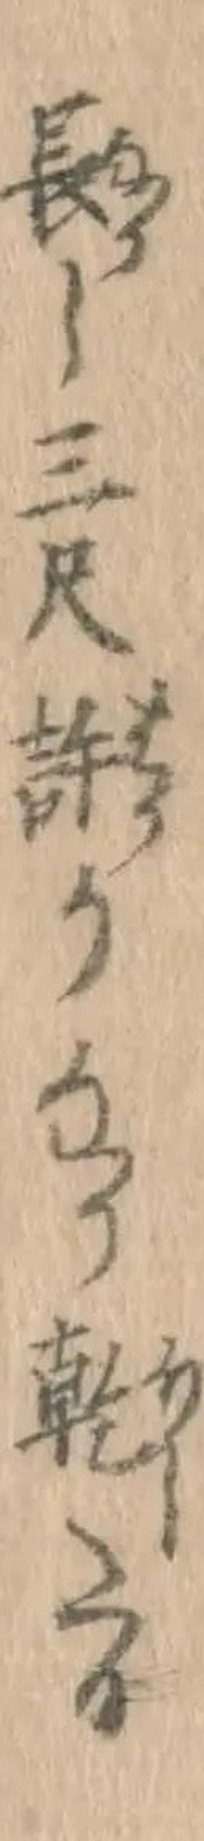長し三尺許りなり乾たる
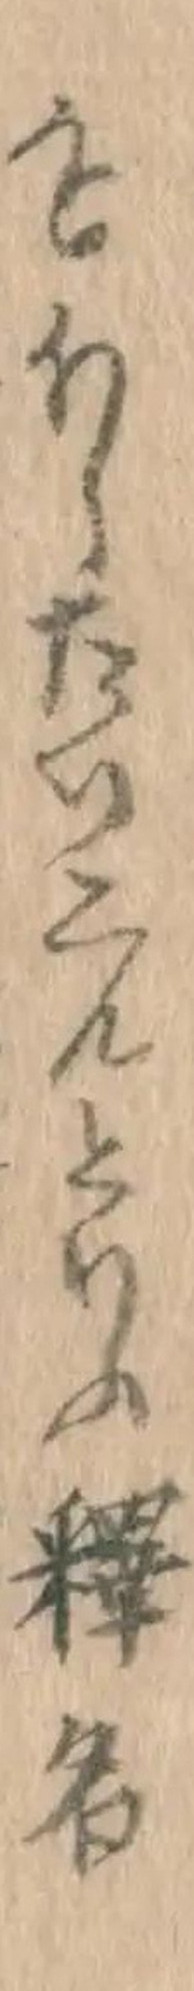をほしたいこんといふ釈名
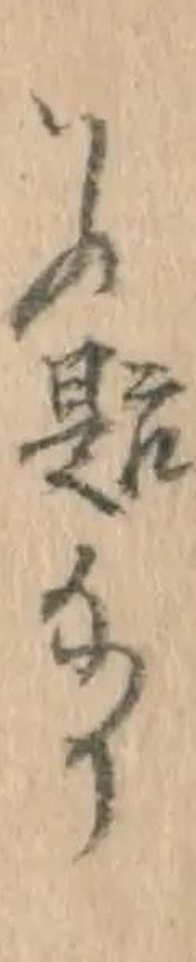いふ是なり

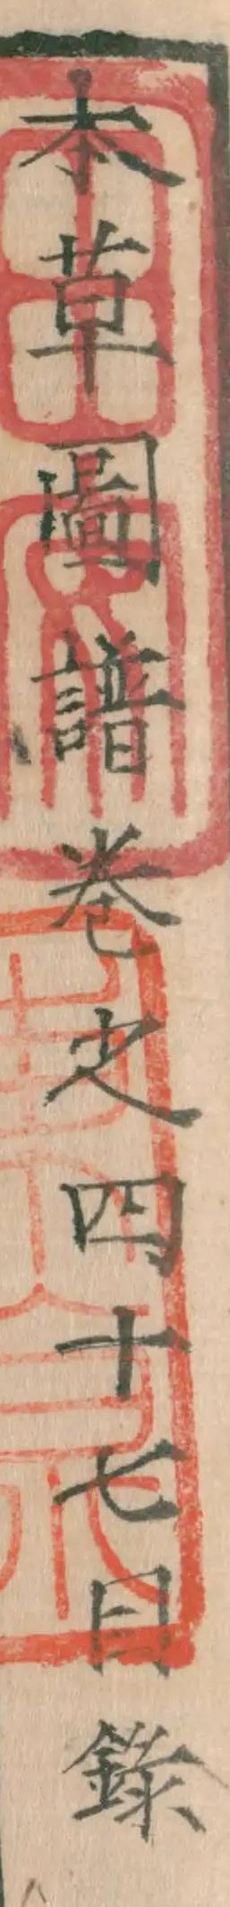本草図譜巻之四十七目録

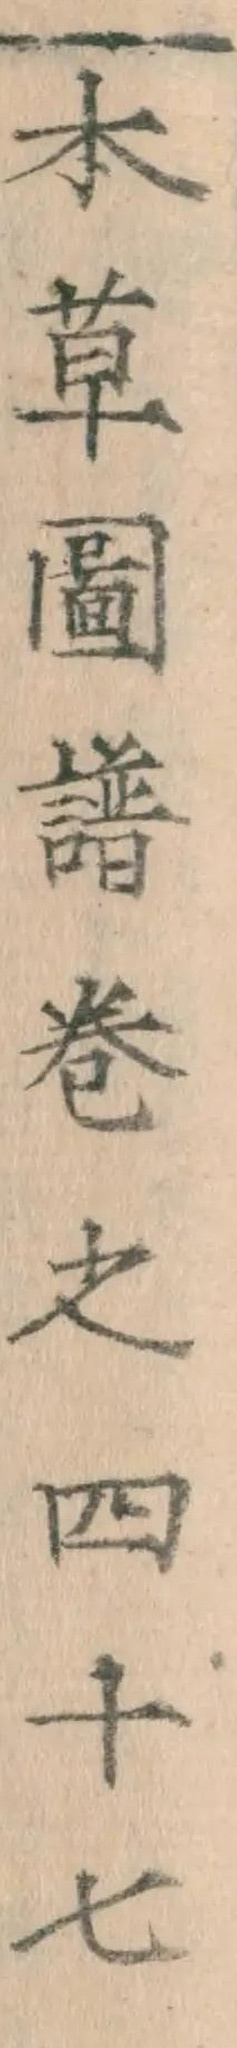本草図譜巻之四十七
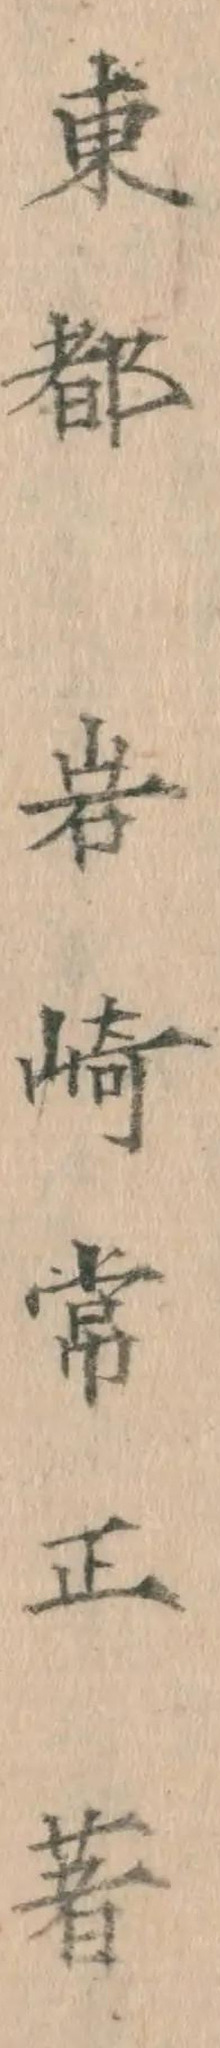東都岩崎常正著
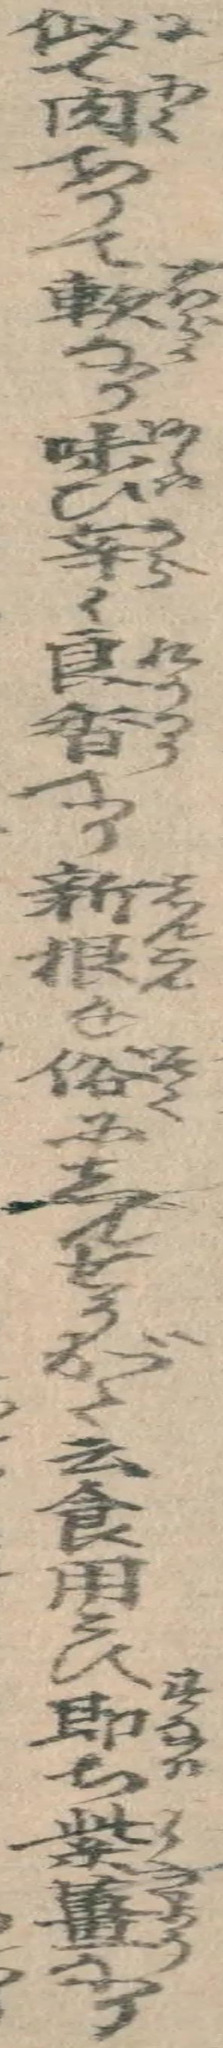似て肉ありて軟なり味ひ辛く良香なり新根を俗にしんせうがと云食用とす即ち紫薑なり
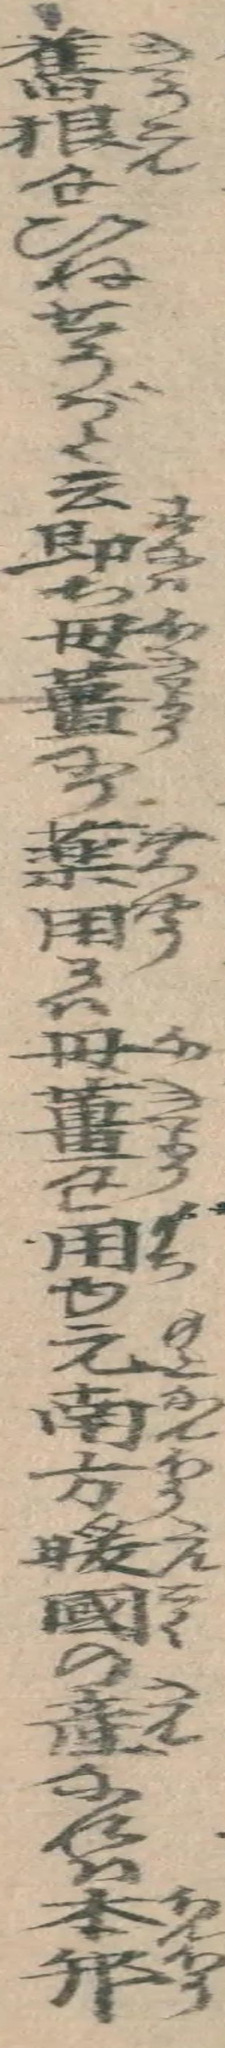旧根をひねせうがと云即ち母薑なり薬用には母薑を用ゆ元南方暖国の産なれは本邦

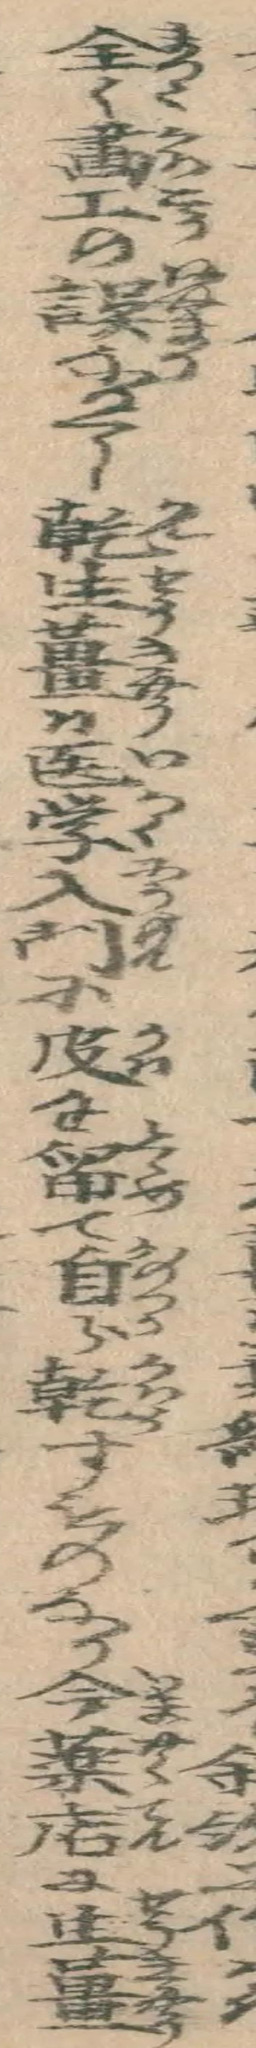全く画工の誤なるへし乾生薑は医学入門に皮を留て自ら乾すものなり今薬に生薑
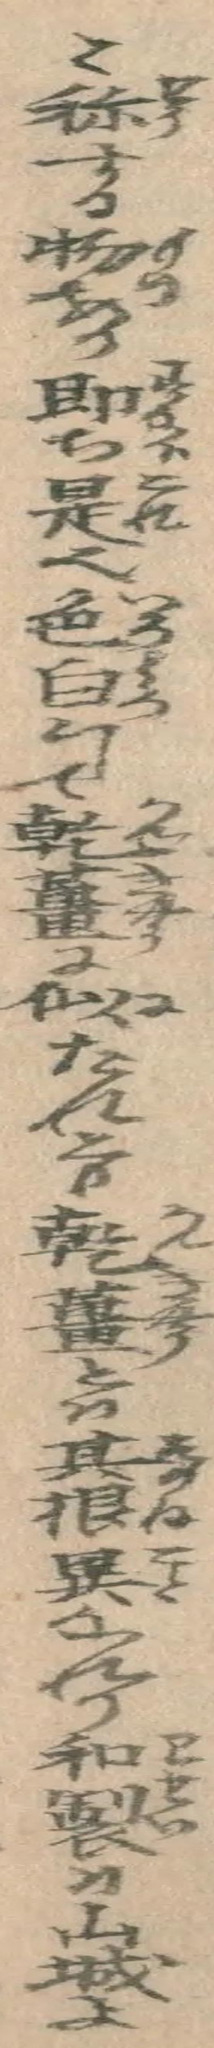と称する物あり即ち是也色白くして乾薑に似たれとも乾薑とは其根異なれり和製は山城よ
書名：本草図譜. 巻46-48
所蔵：国立国会図書館 National Diet Library, JAPAN
